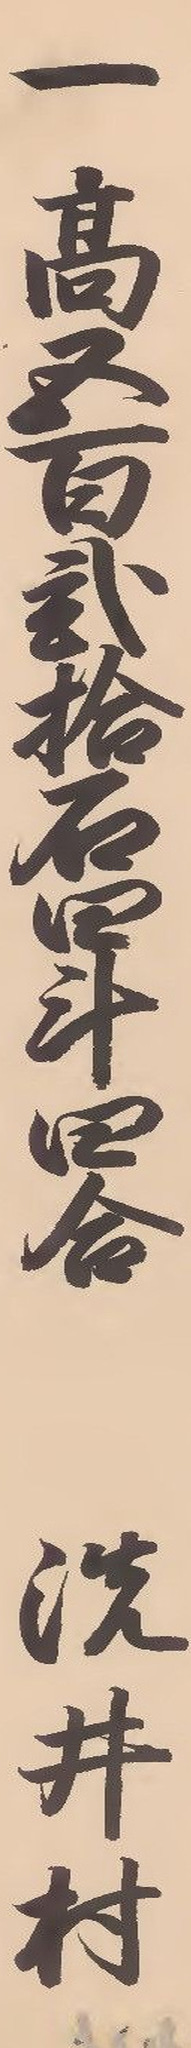一高五百弐拾石四斗四合洗井村

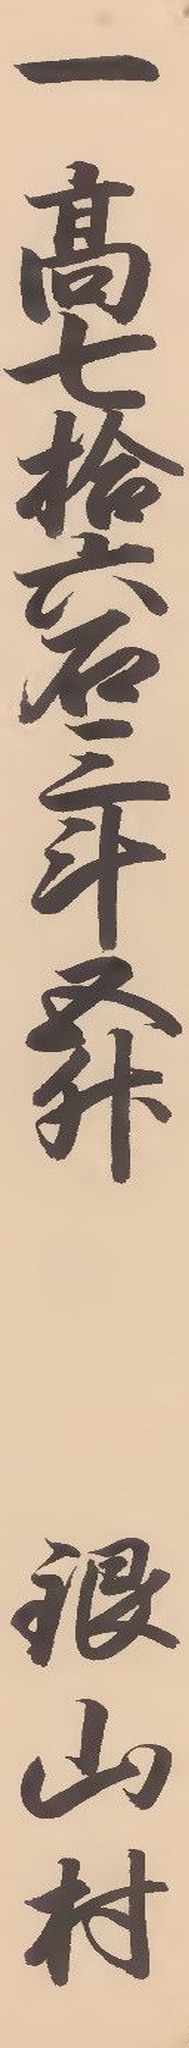一高七拾六石三斗五升銀山村
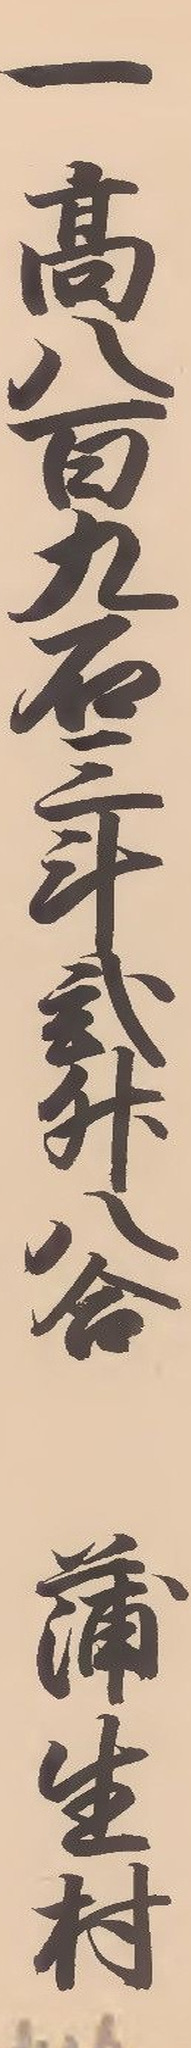一高八百九石三斗弐升八合蒲生村
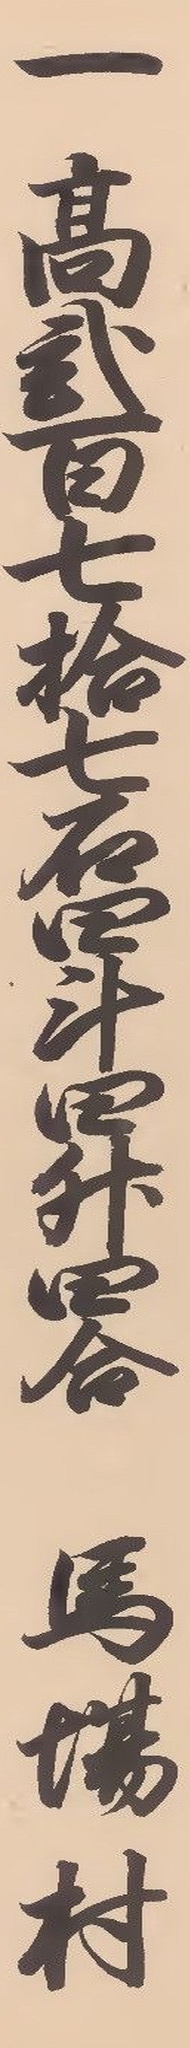一高弐百七拾七石四斗四升四合馬場村
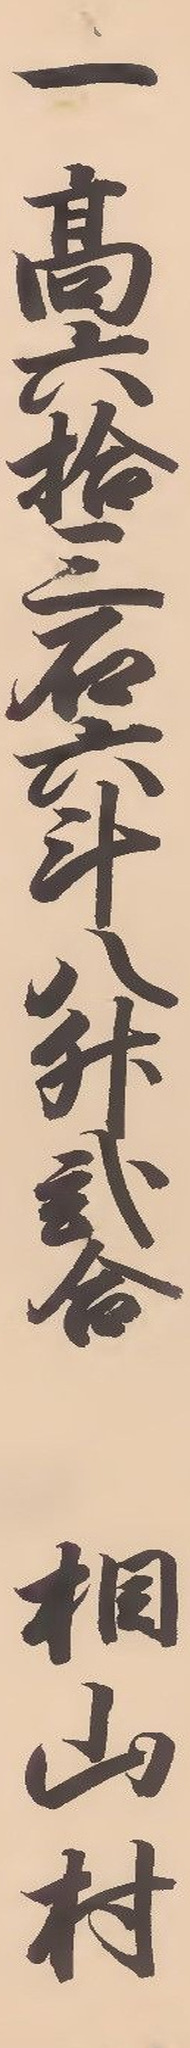一高六拾三石六斗八升弐合相山村
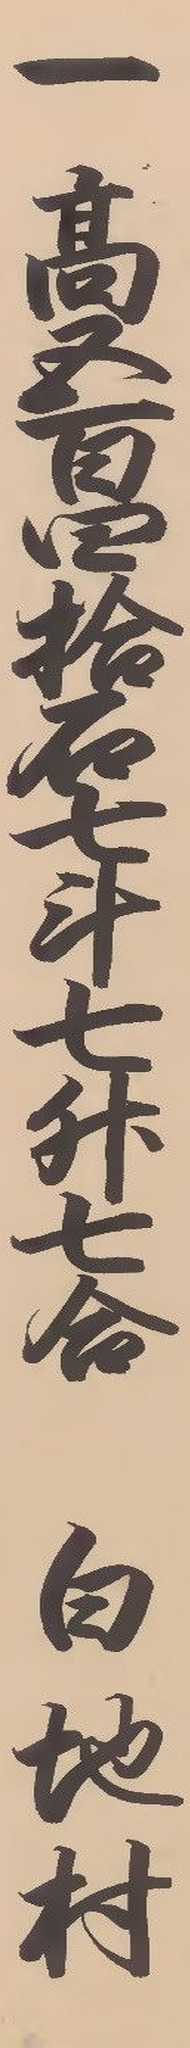一高五百四拾石七斗七升七合白地村
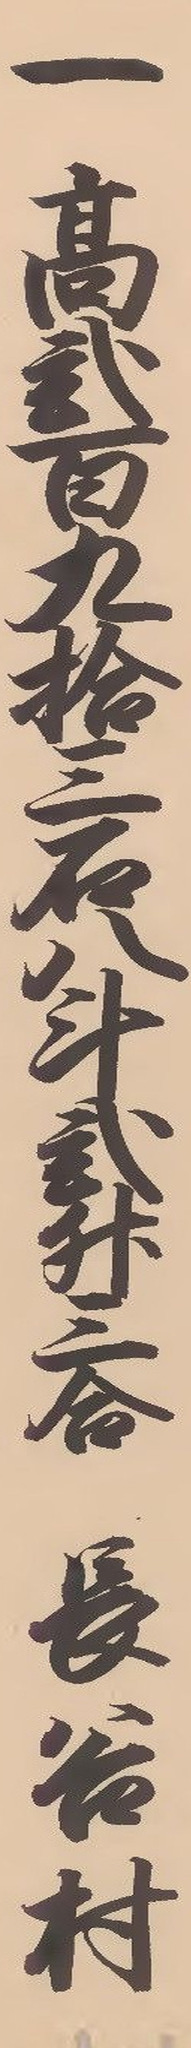一高弐百九拾三石八斗弐升三合長谷村
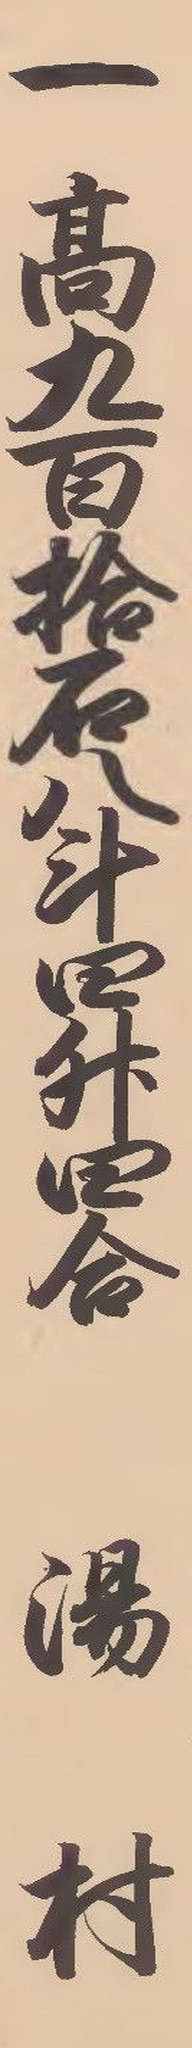一高九百拾石八斗四升四合湯村

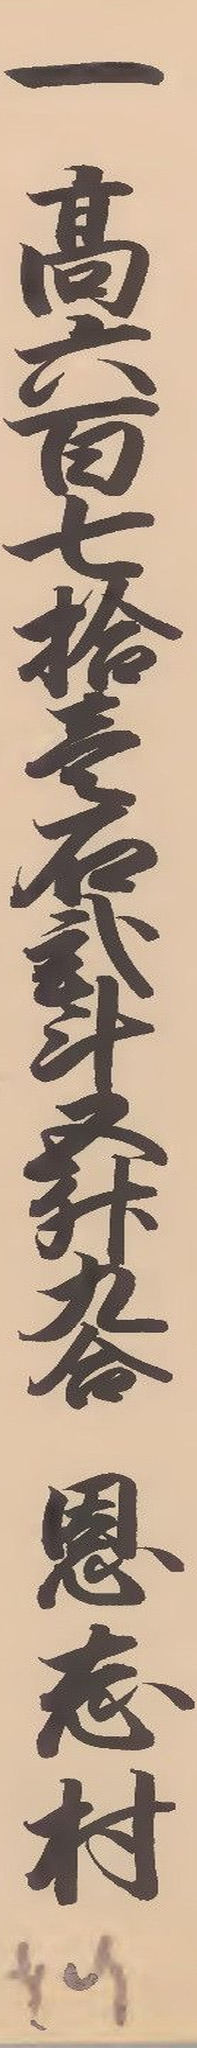一高六百七拾壱石弐斗五升九合恩志村
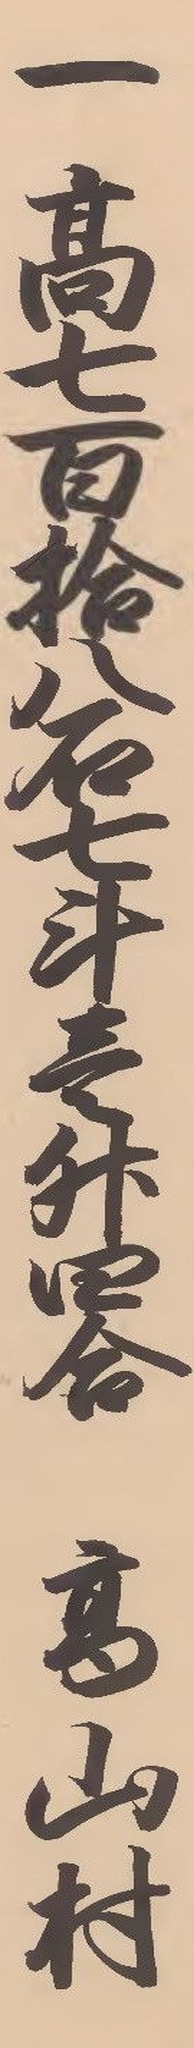一高七百拾八石七斗壱升四合高山村
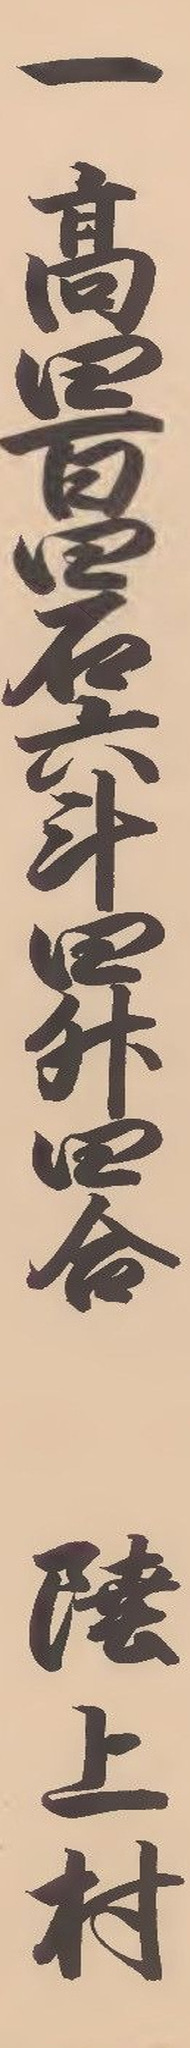一高四百四石六斗四升四合陸上村
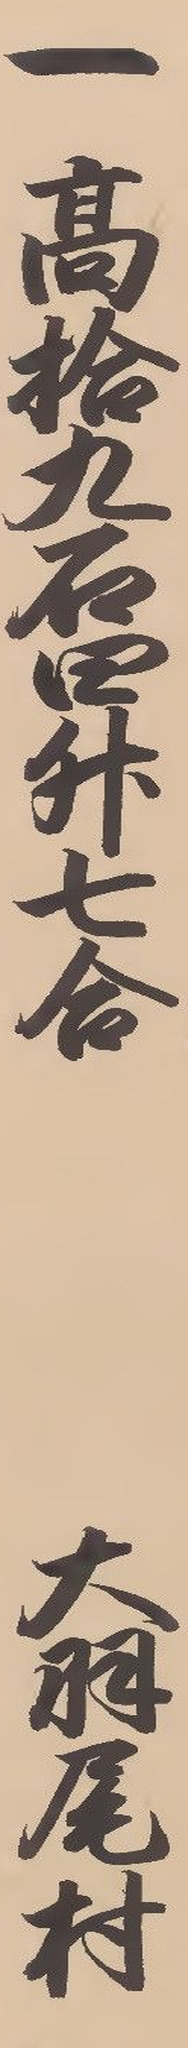一高拾九石四升七合大羽尾村
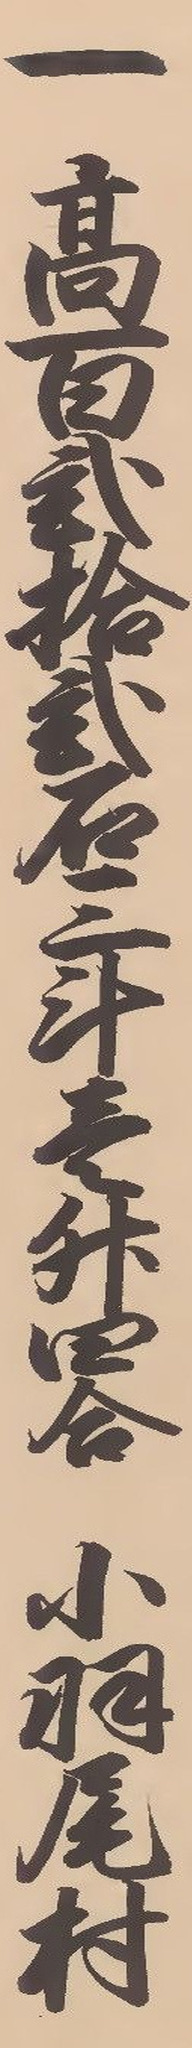一高百弐拾弐石三斗壱升四合小羽尾村
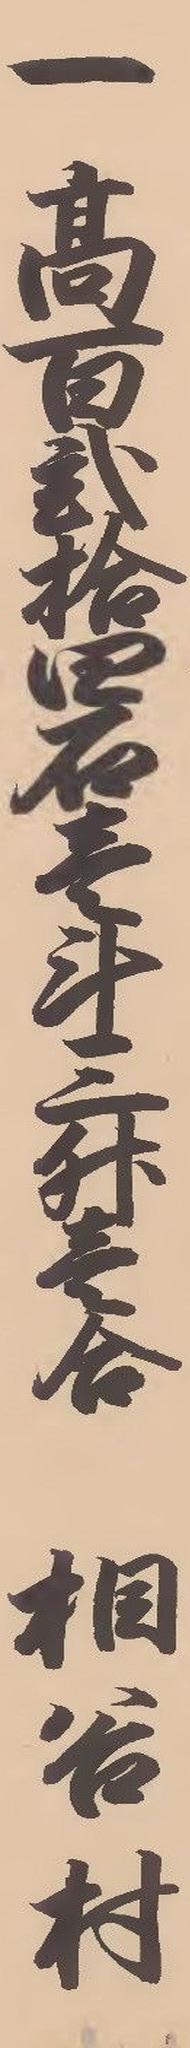一高百弐拾四石壱斗三升壱合相谷村
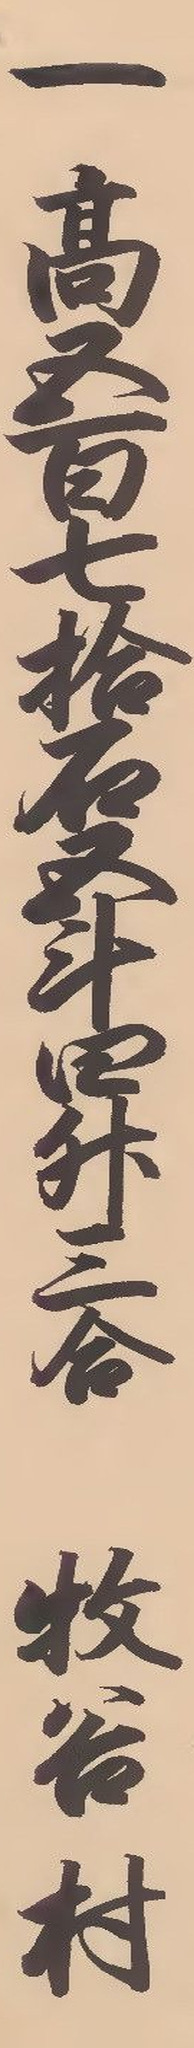一高五百七拾石五斗四升三合牧谷村

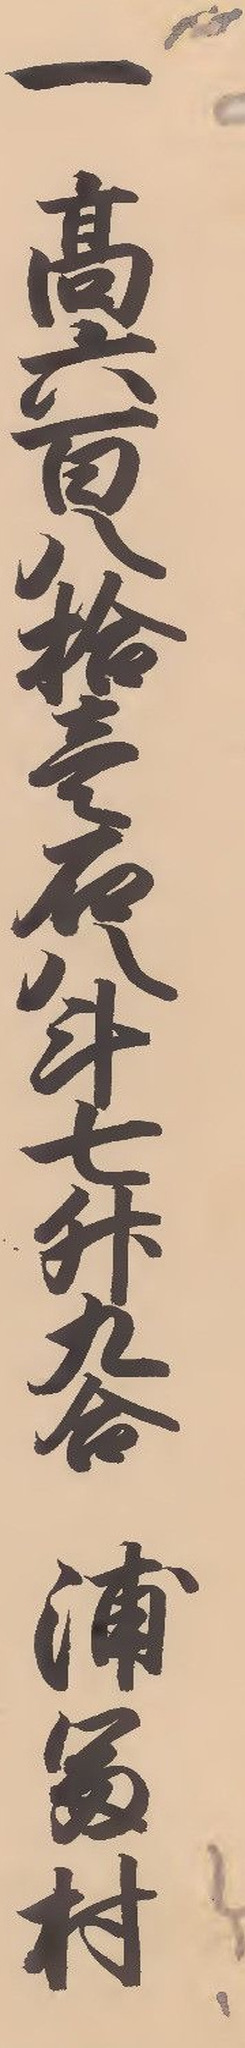一高六百八拾壱石八斗七升九合浦富村
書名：因幡国郷帳
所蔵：国立公文書館 National Archives of Japan
